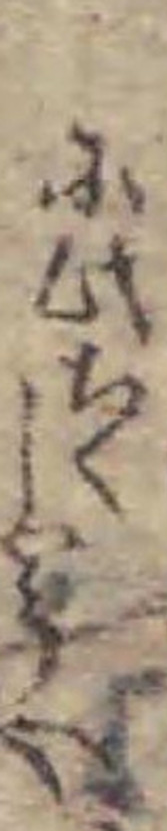に此ちくしやう
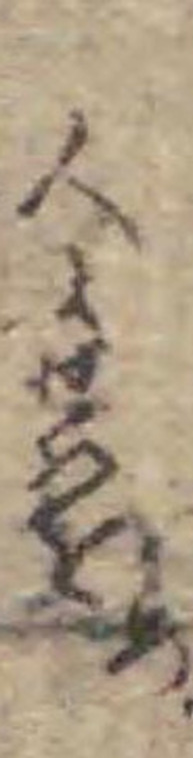人にせはを
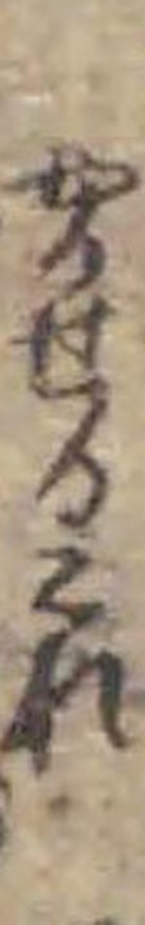やかせるこれ
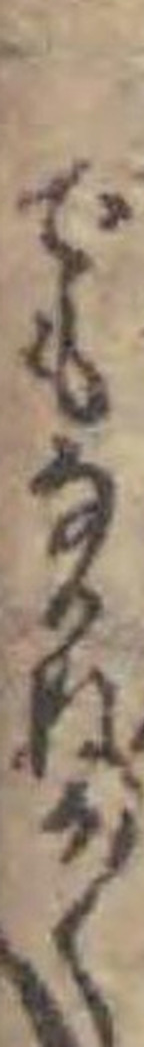でもなかぬか〳〵

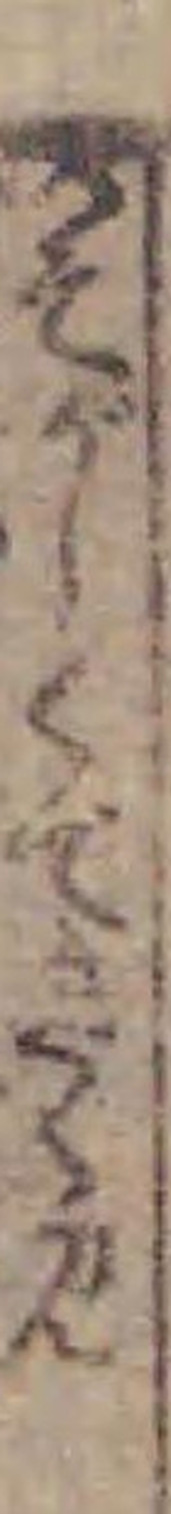いそがしくてきく見
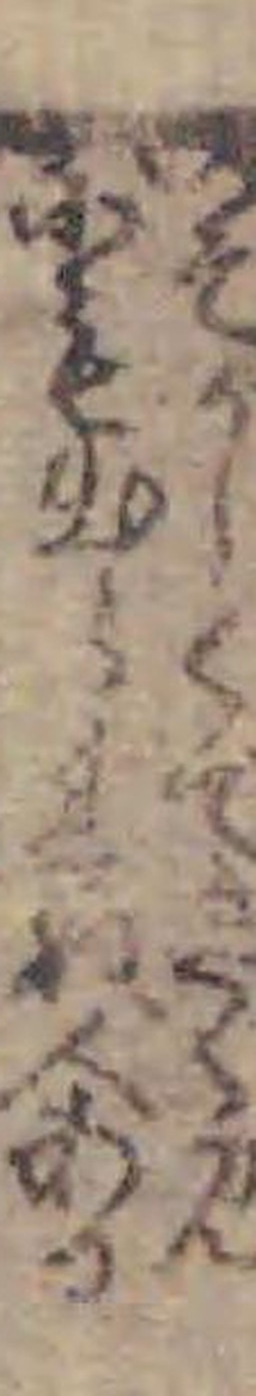にも出られぬ人ある
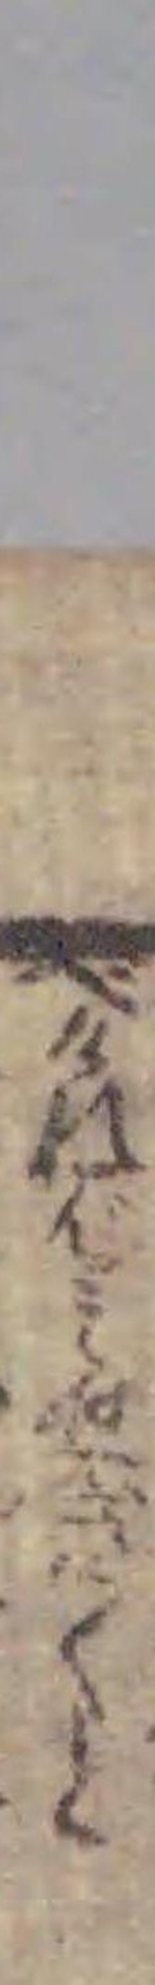べければみせきくと
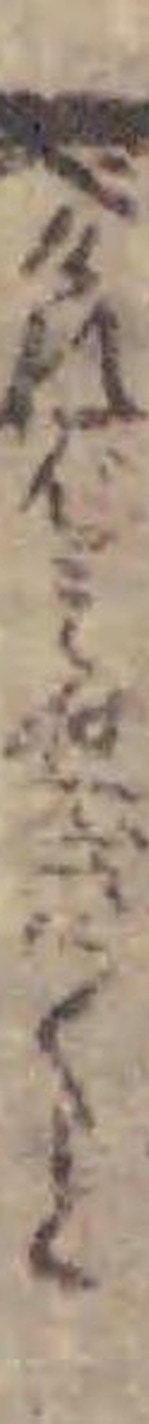べければみせきくと
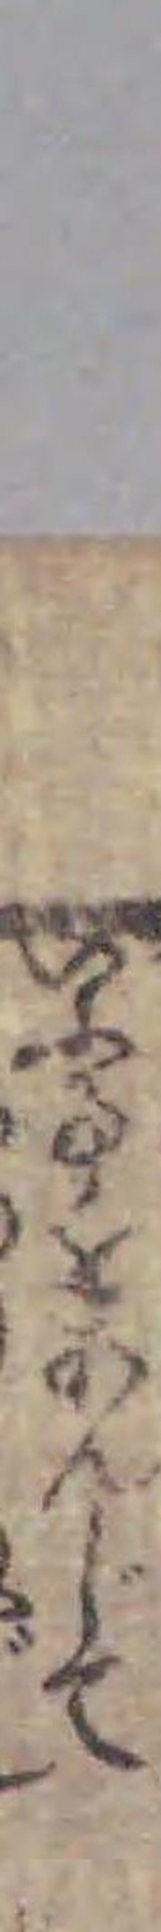いふ事をあんじて
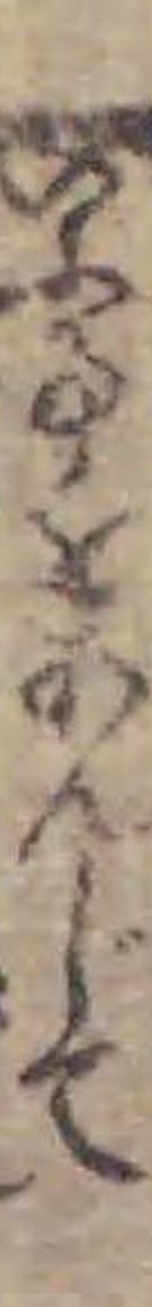いふ事をあんじて
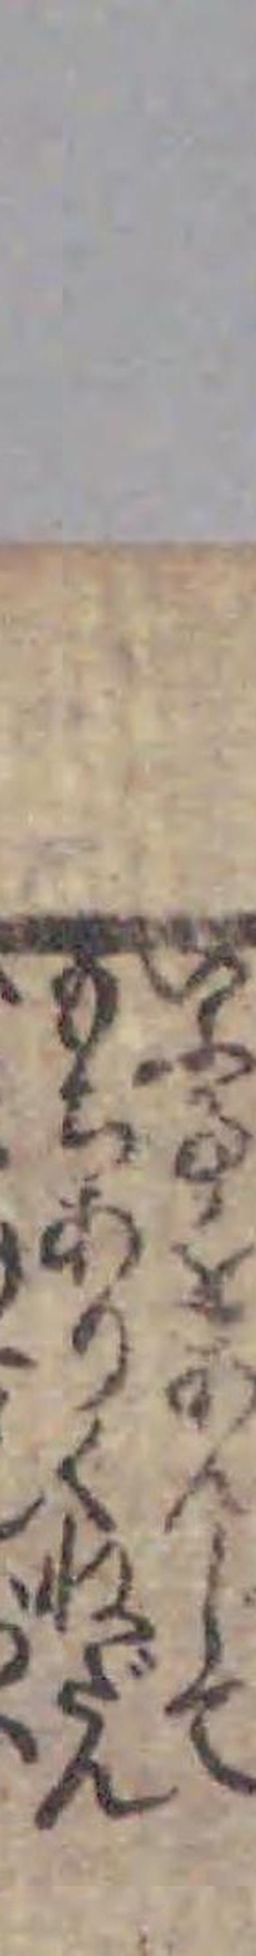もちありくねだん
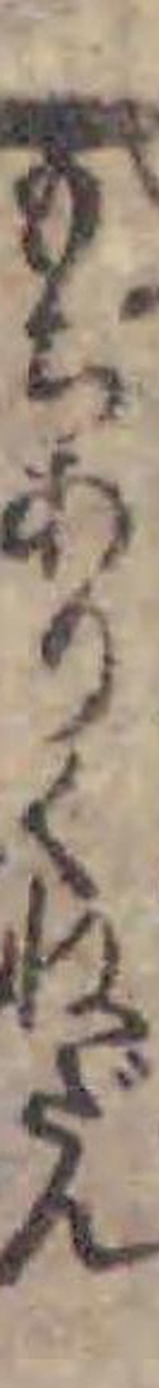もちありくねだん
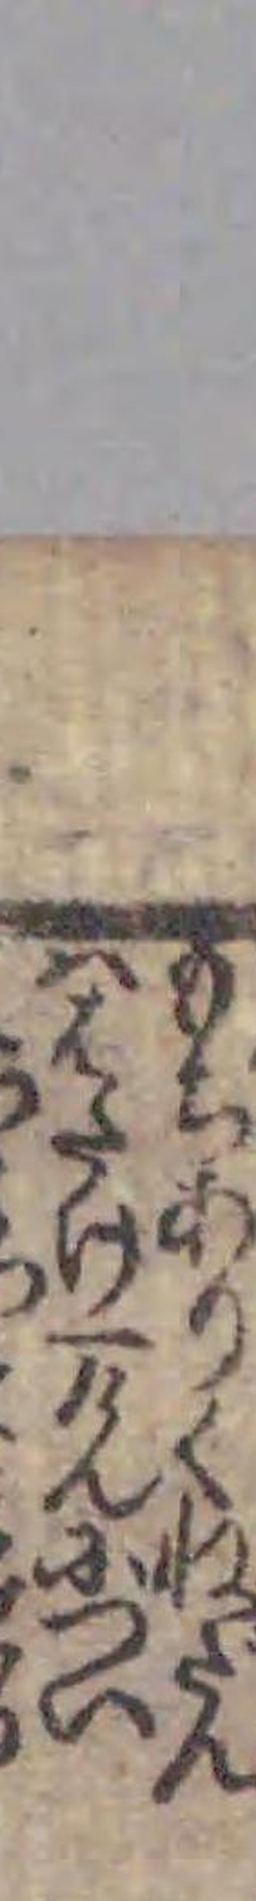ははたけ一けんについ
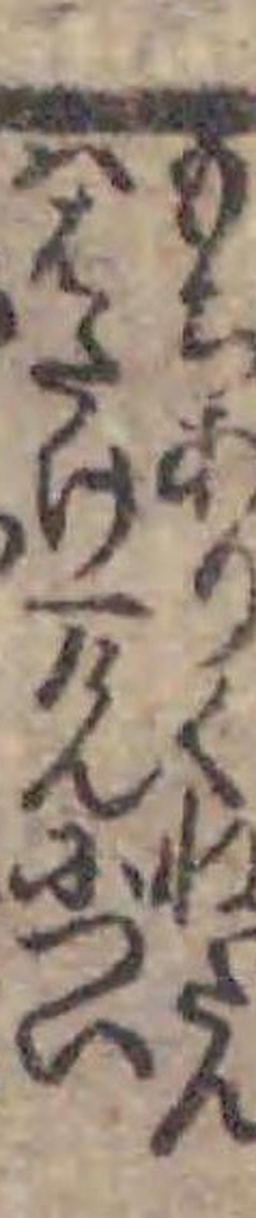ははたけ一けんについ
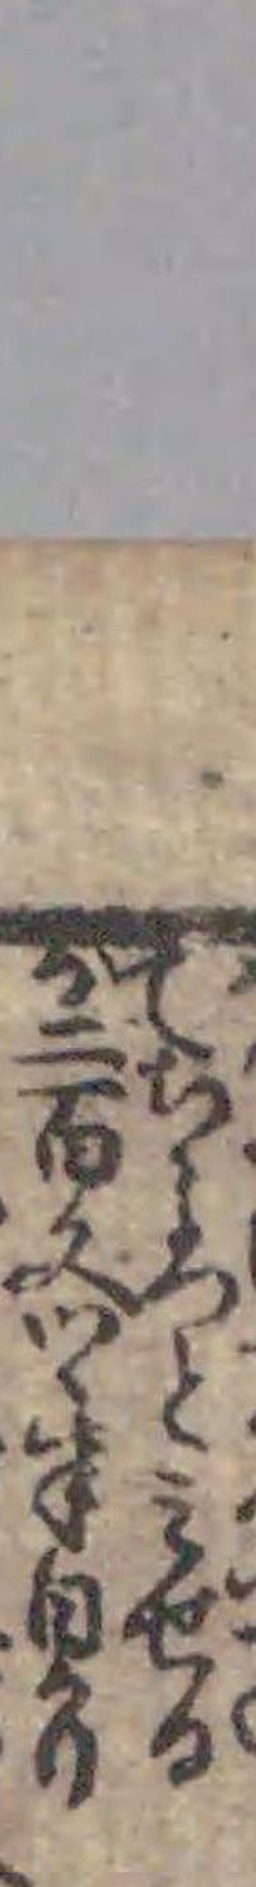が二百文つゝ半日かり
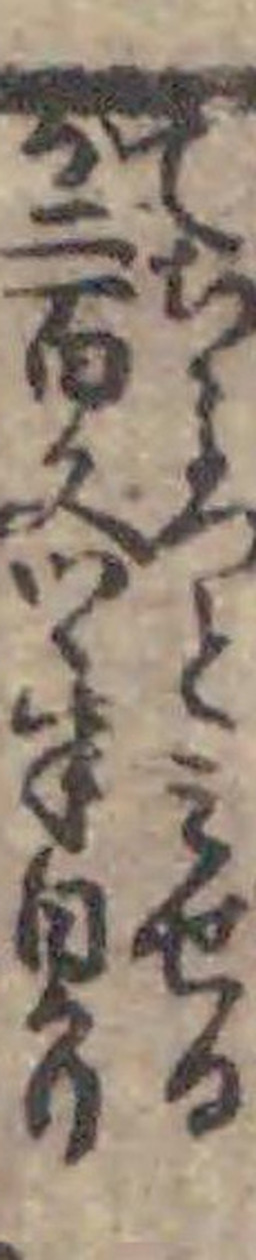が二百文つゝ半日かり
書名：本樹真猿浮気噺 : 3巻
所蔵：国立国会図書館 National Diet Library, JAPAN
